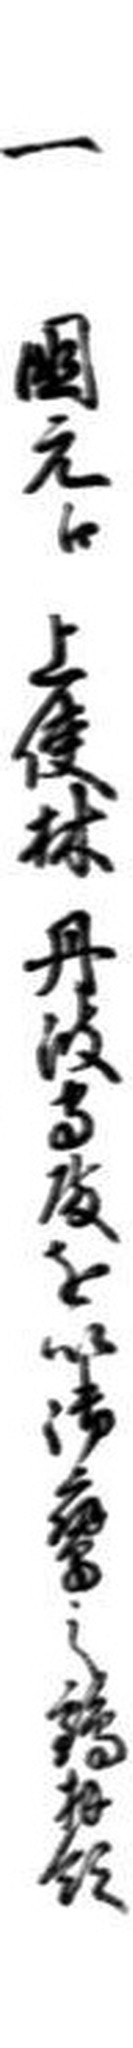一国元江上使林丹波守殿を以御鷹之鶴拝領
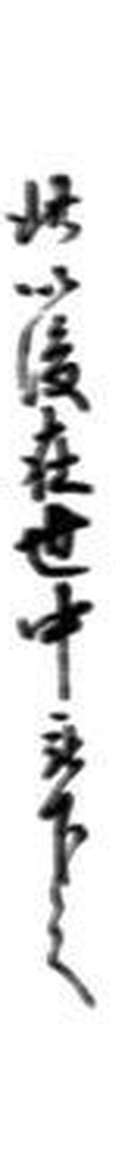此以後在世中被下之
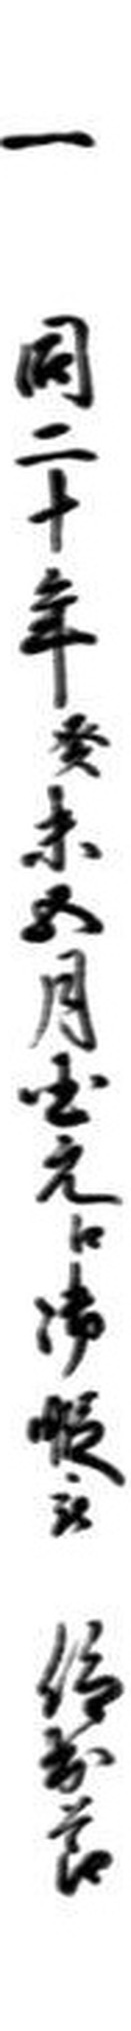一同二十年癸未五月国元江御暇被仰出節

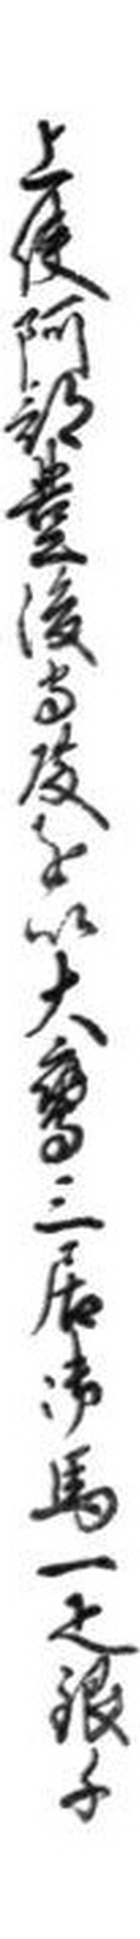上使阿部豊後守殿を以大鷹三居御馬一疋銀千
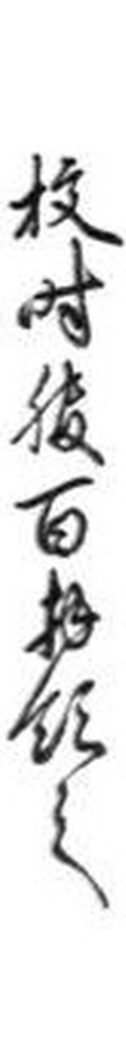枚時服百拝領之
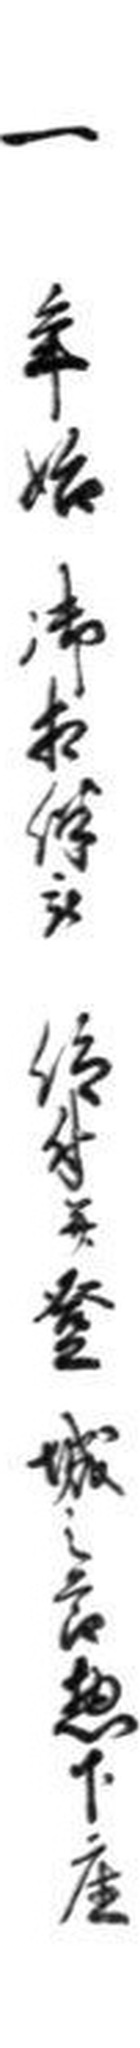一年始御相伴被仰付并登城之節惣下座
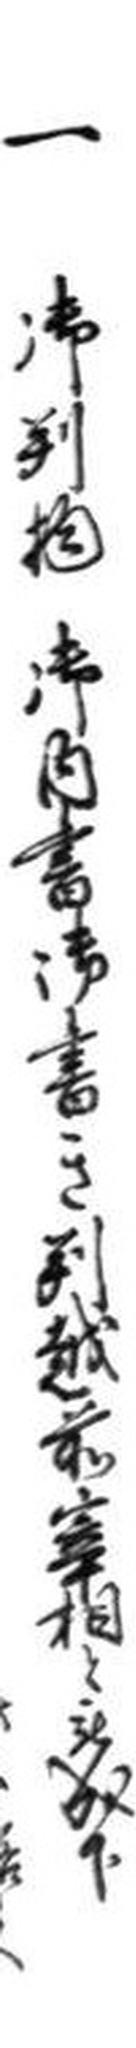一御判物御内書御書き判越前宰相と披成下
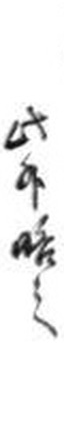此外略之
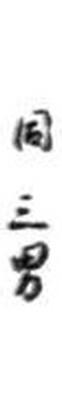同三男
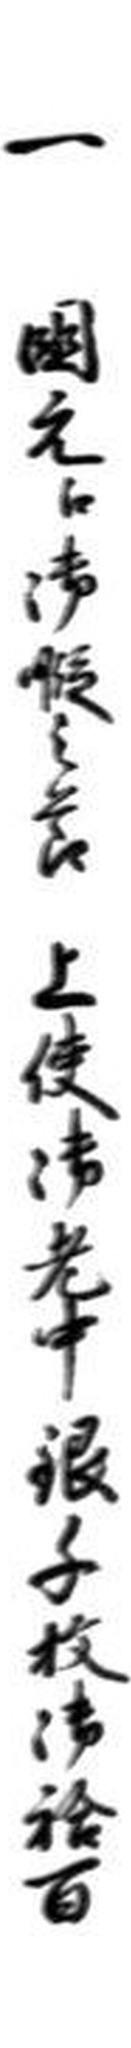一国元江御暇之節上使御老中銀千枚御袷百
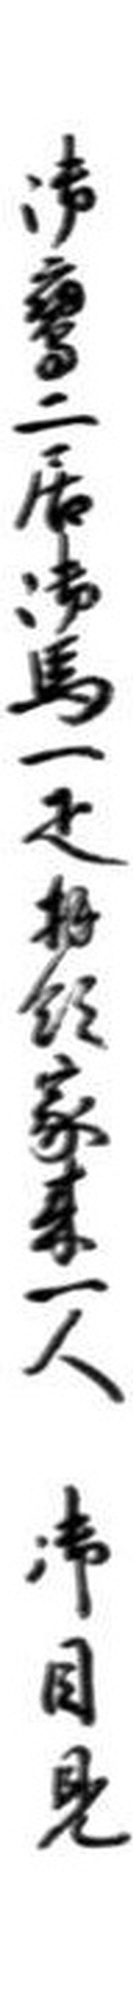御鷹二居御馬一疋拝領家来一人御目見
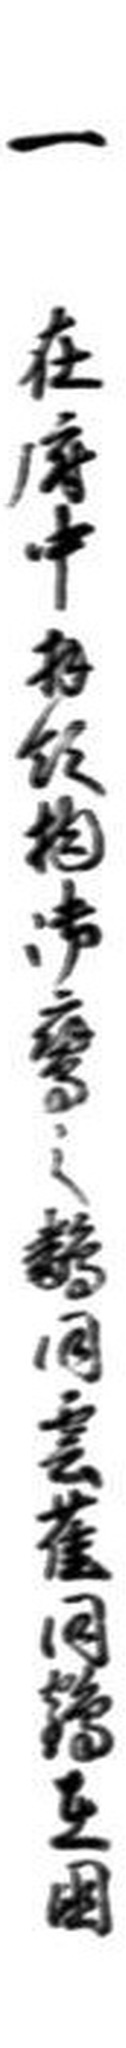一在府中拝領物御鷹之鷭同雲雀同鶴在国
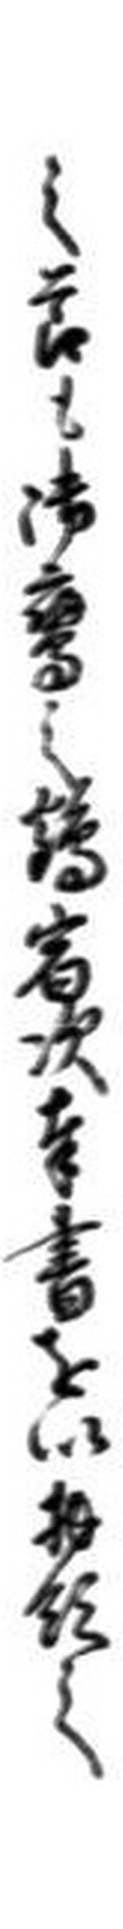之節も御鷹之鶴宿次奉書を以拝領之
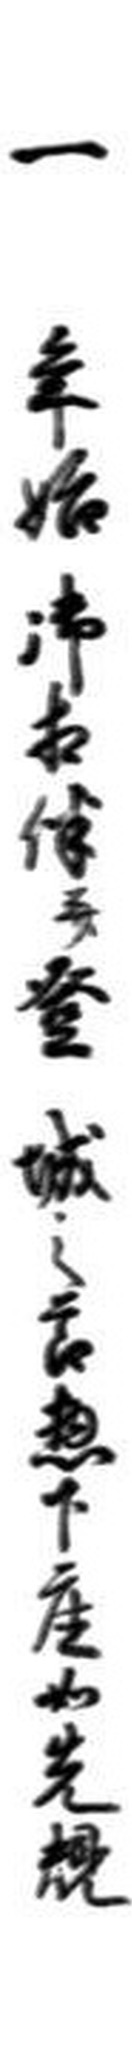一年始御相伴并登城之節惣下座如先規
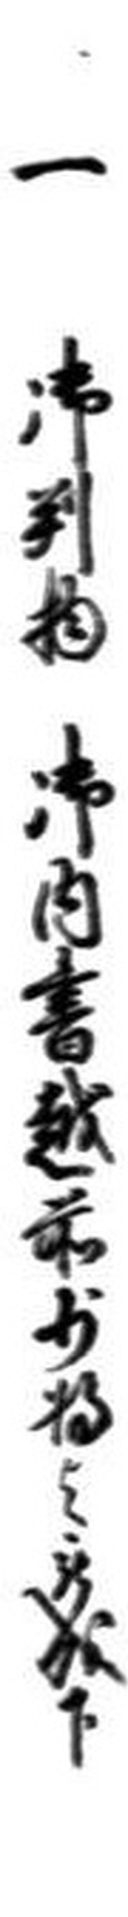一御判物御内書越前少将と披成下

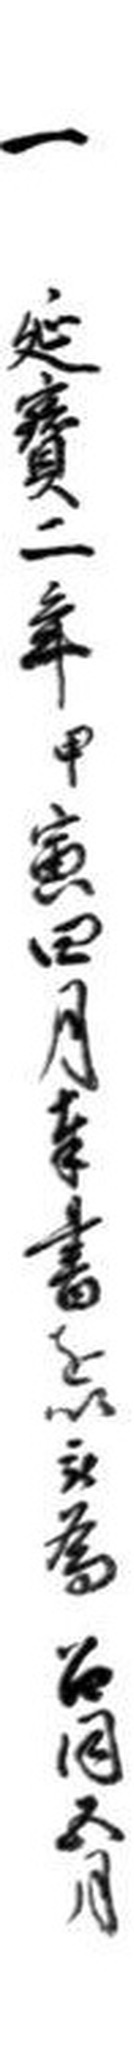一延宝ニ年甲寅四月奉書を以被為召五月
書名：家譜 三十一 吉邦公 享保元年
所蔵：福井県文書館 Fukui Prefectural Archives
